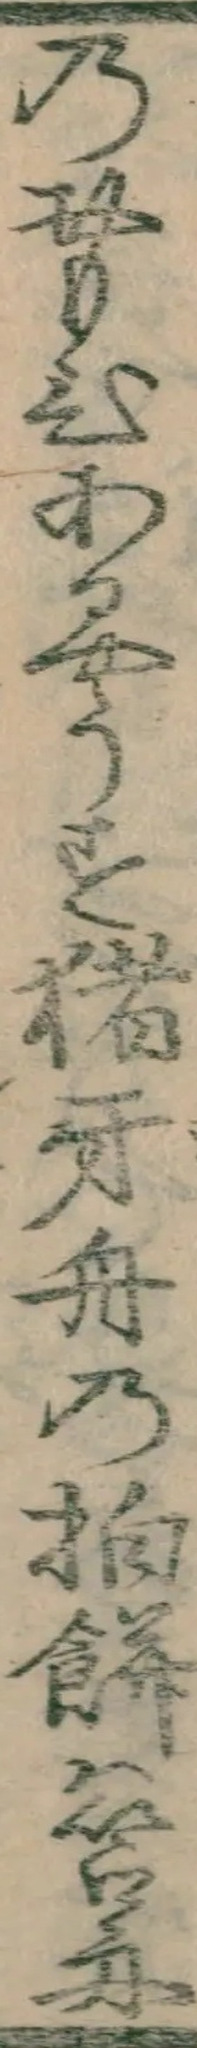のおもひあるやうす猪牙舟の柏餅は苫舟
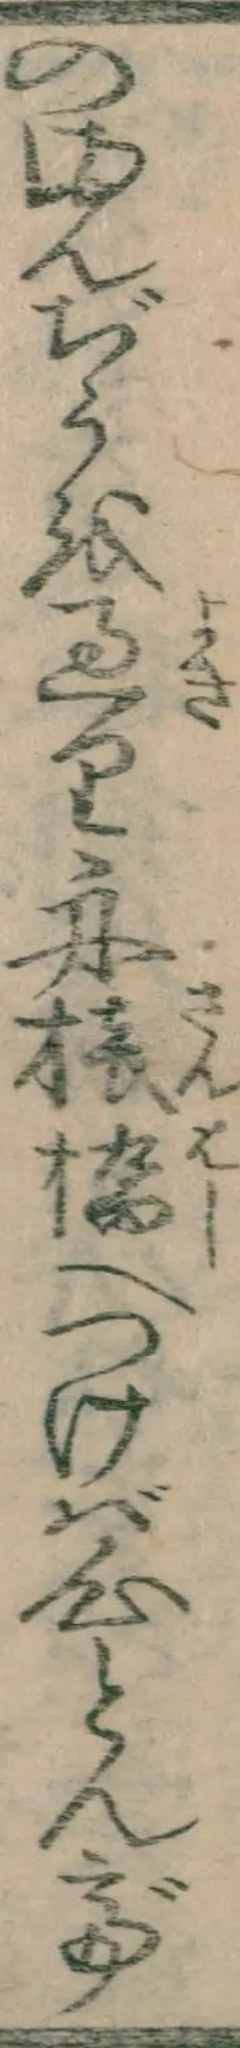のまんぢうを過り舟桟橋へつけば心とんで
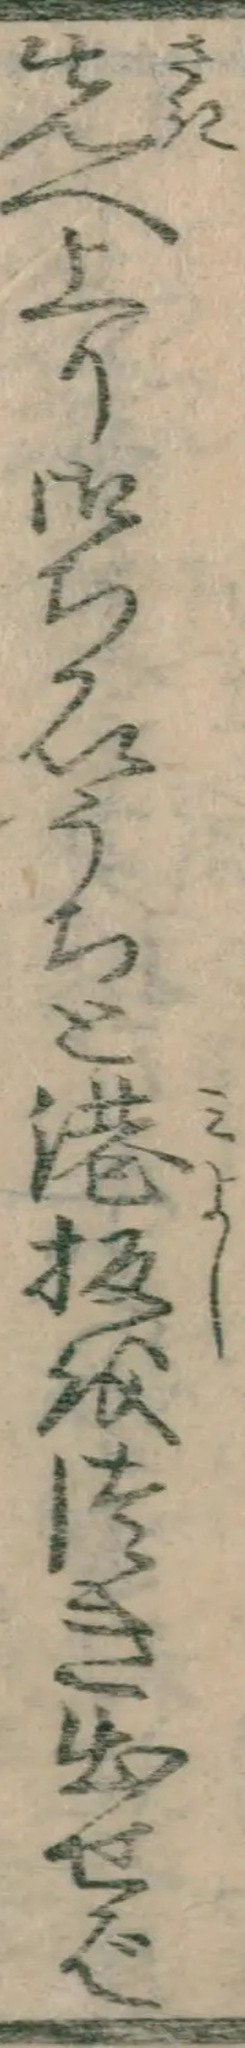先へ上り御ちかいうちと港板をつき出せば
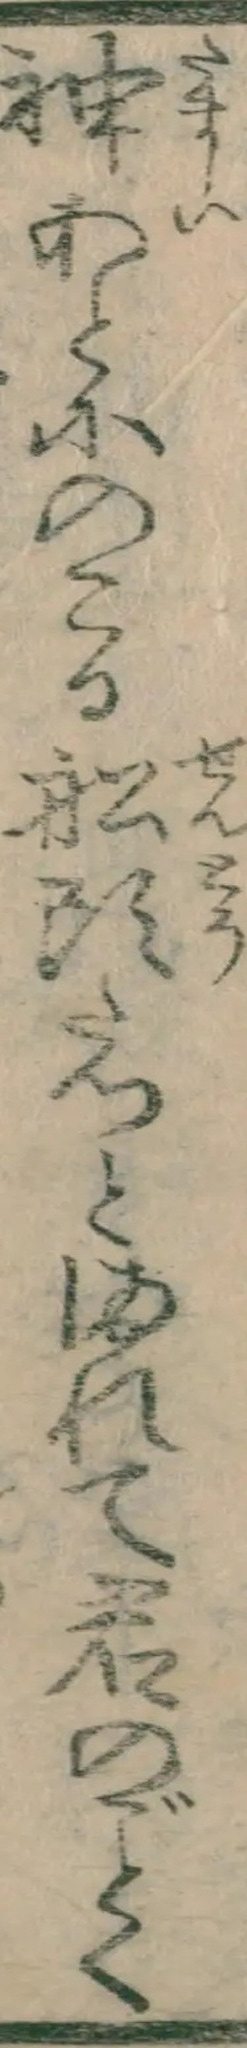神あとにのこる船頭たつとまれて君のごとく
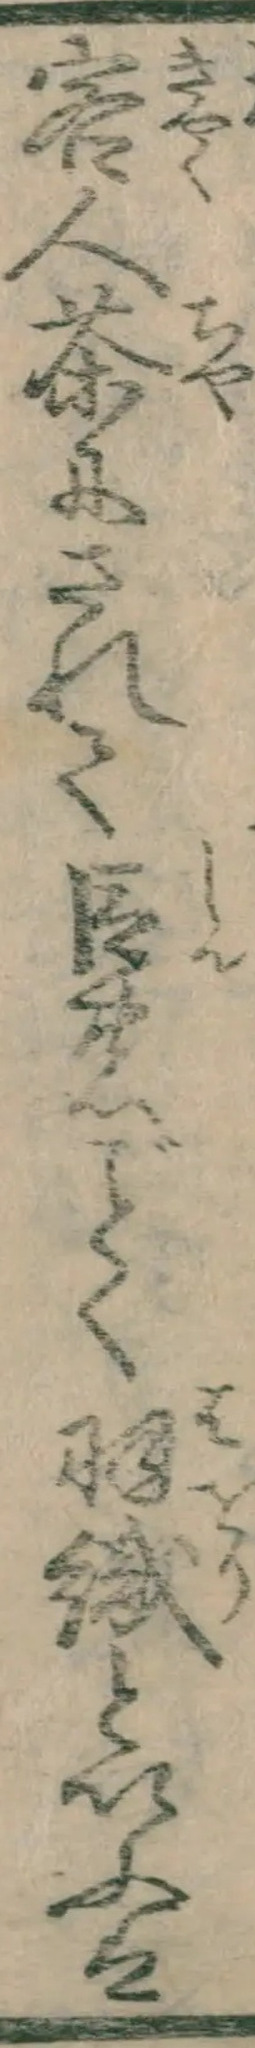客人茶にされて臣のごとく羽織といふは

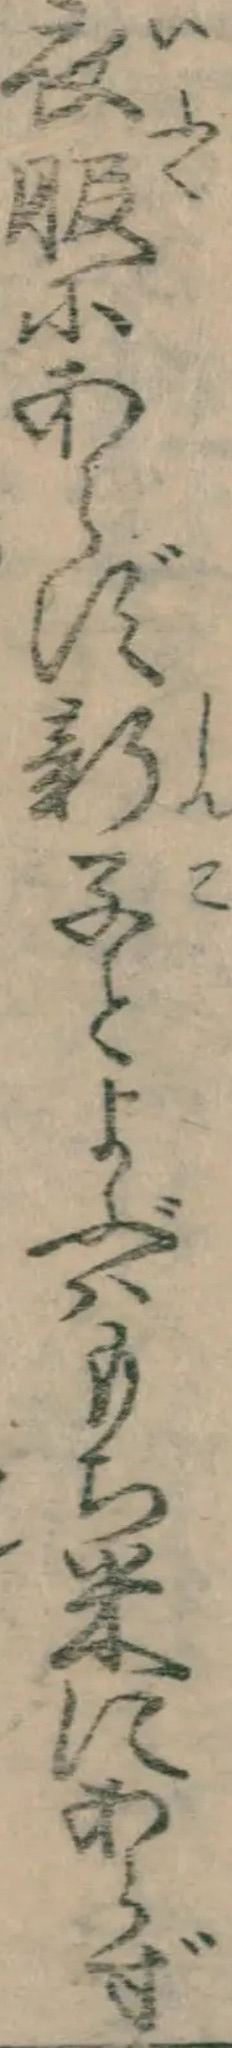衣服にあらず新子とよぶはもち米にあらず
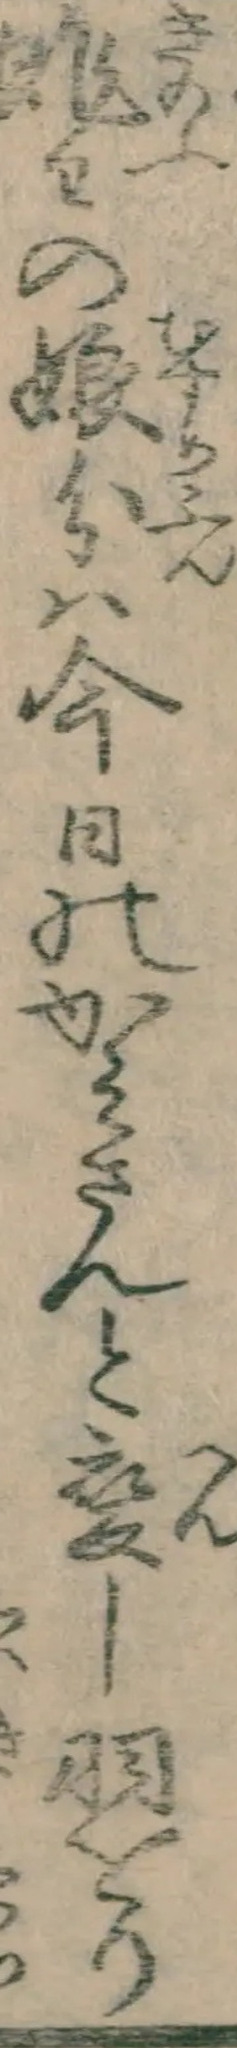昨日娘分は今日のかみさんと変し羽をり
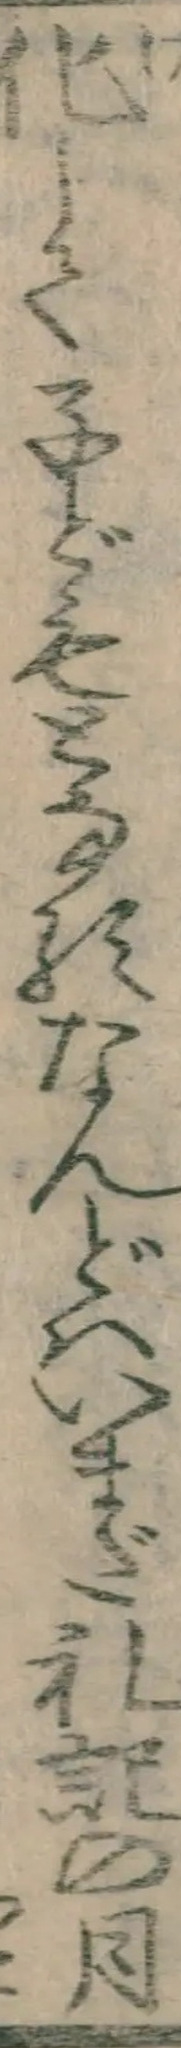化して子どもとなるなんどはいまだ礼記の月
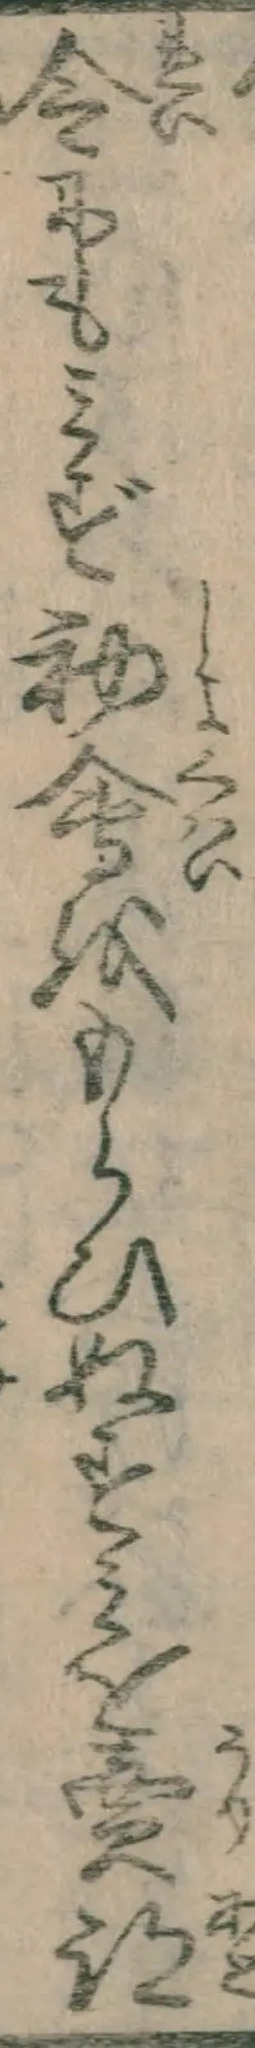令にもみず初会をもらひぬすみを売跡
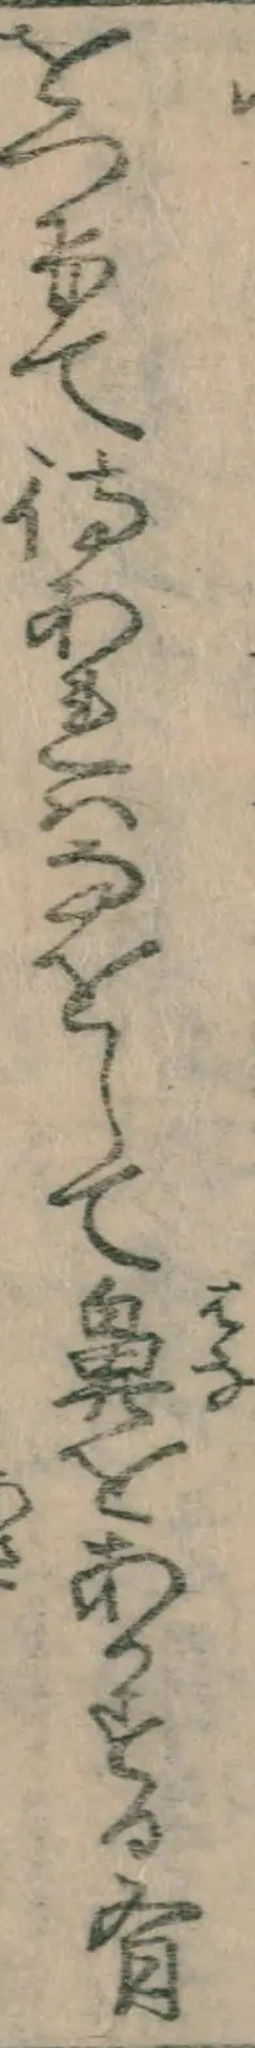をつけて待あれはなをして鼻をあかする有
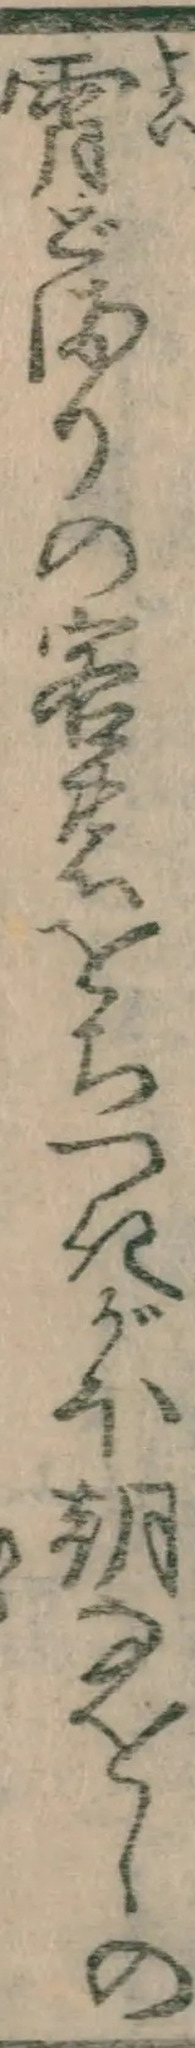宵どまりの客のをちつきがほ朝なをしの
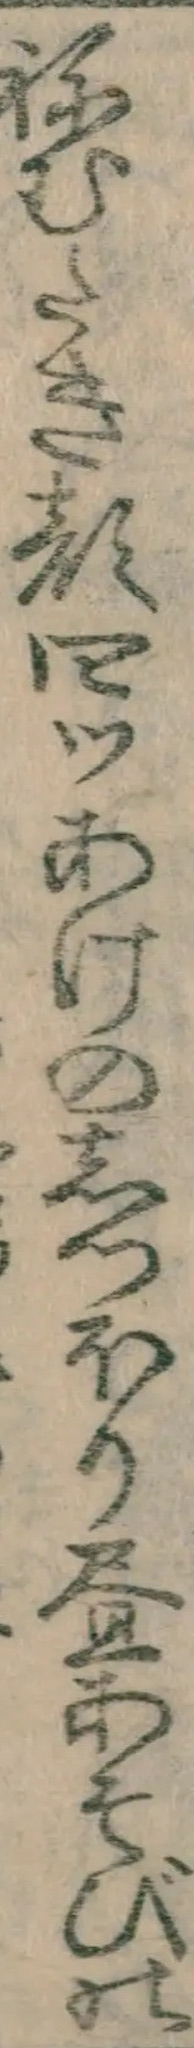ねむたき顔四ツあけのしつほり昼あそびの
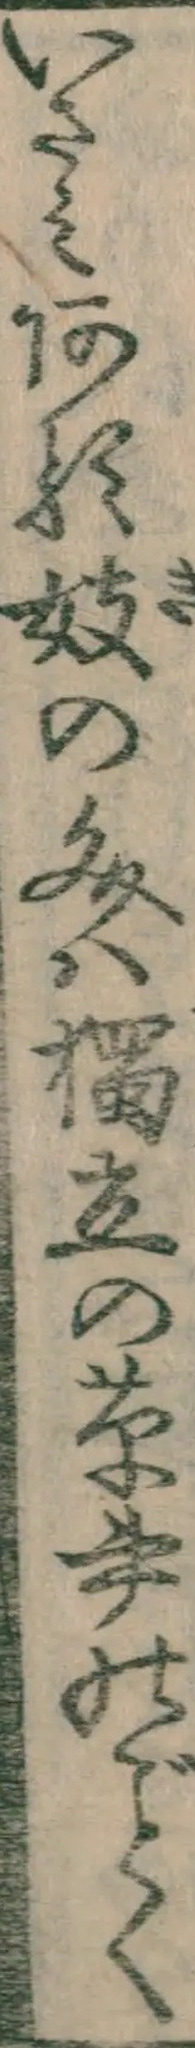いさみある妓の文は独立の草書のごとく
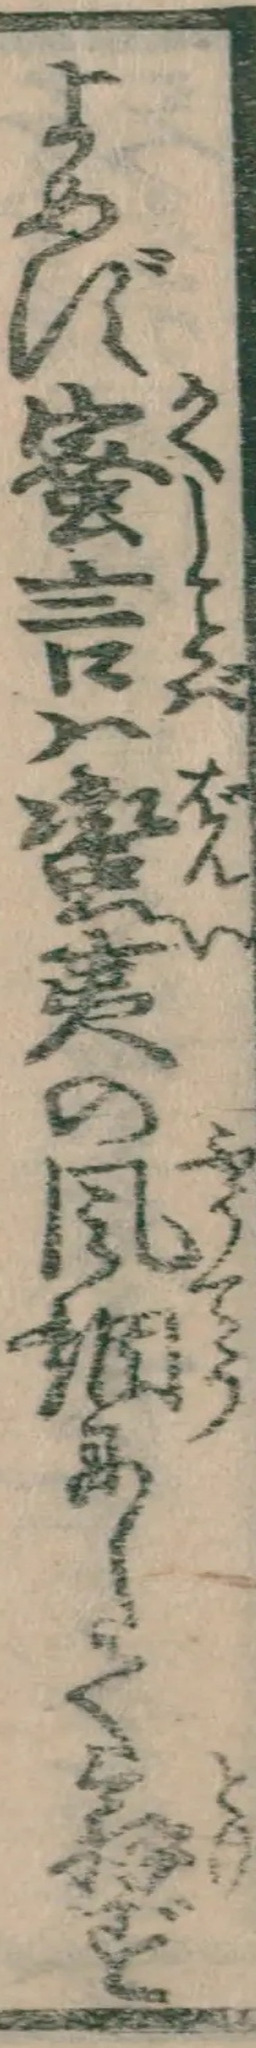よめず蜜言は蛮夷の風調にして解ず
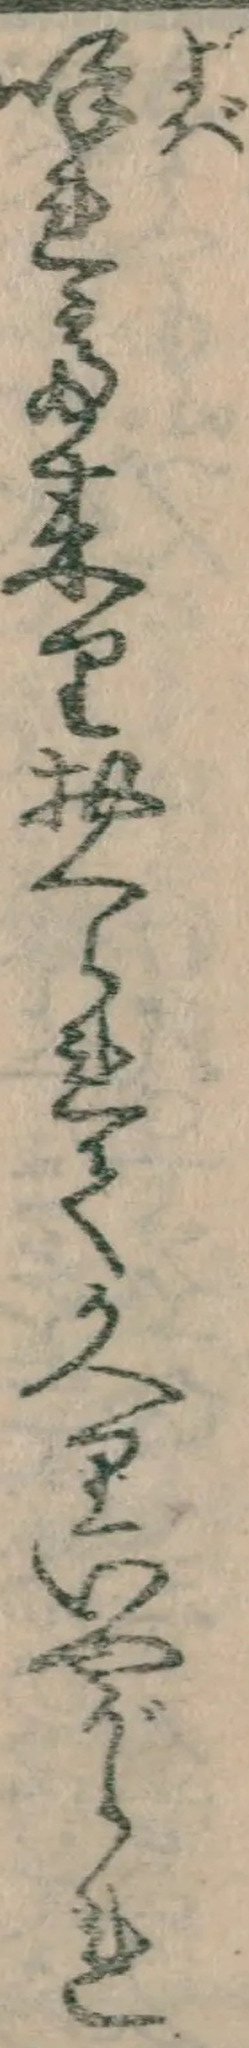呼れて来りおくられてかへりいやがられ
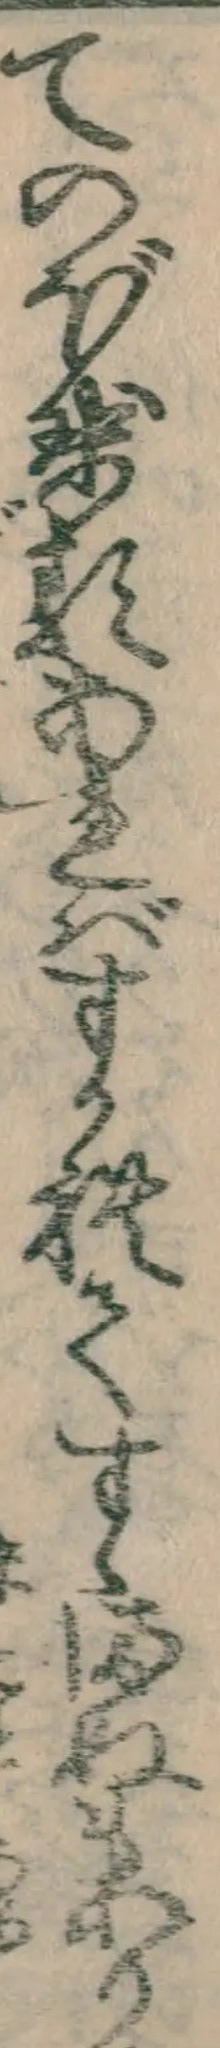てのぼせるあればすかれてすゝまぬもあり
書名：教訓読本：大礒風俗仕懸文庫
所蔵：国立国会図書館 National Diet Library, JAPAN
